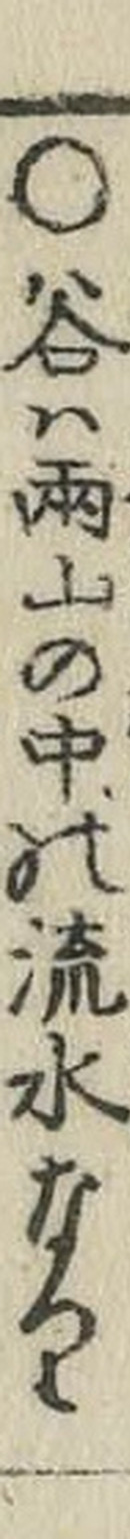○谷は両山の中の流水なり
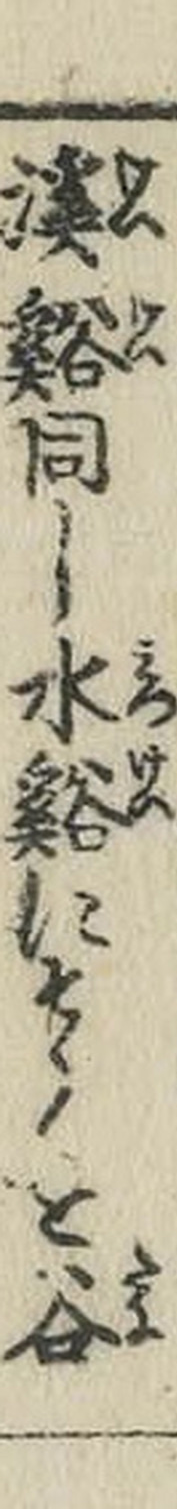渓谿同し水谿にそゝくを谷
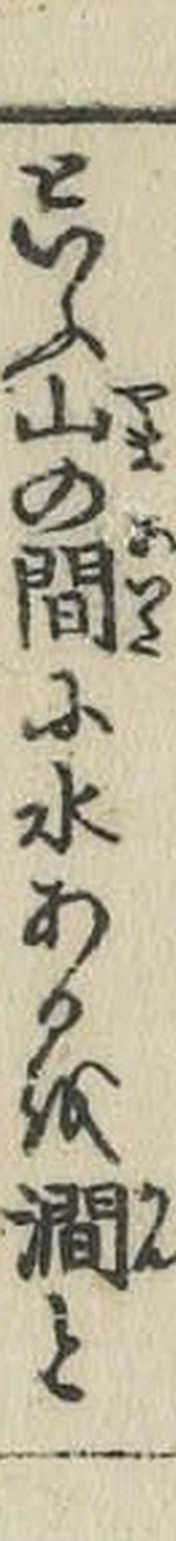といふ山の間に水あるを澗と
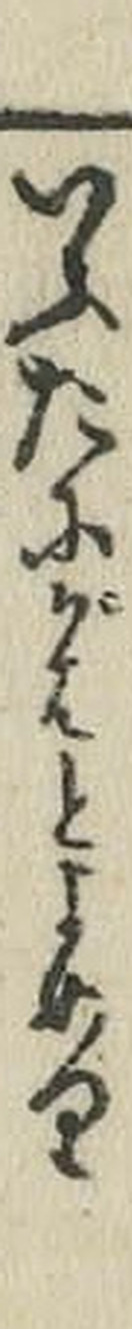いふたにがはとよめり
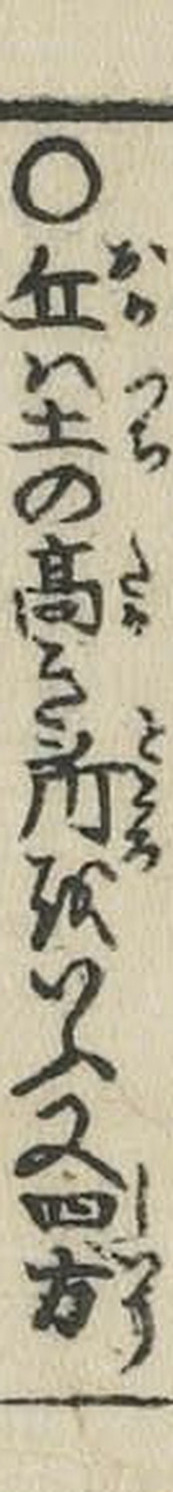○丘は土の高き所をいふ又四方
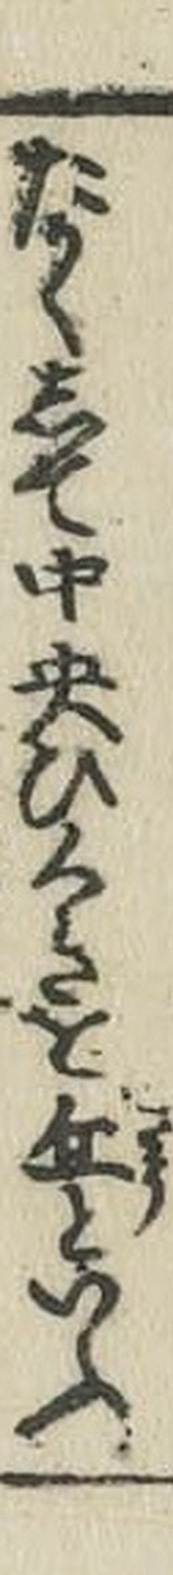たかくして中央ひろきを丘といふ
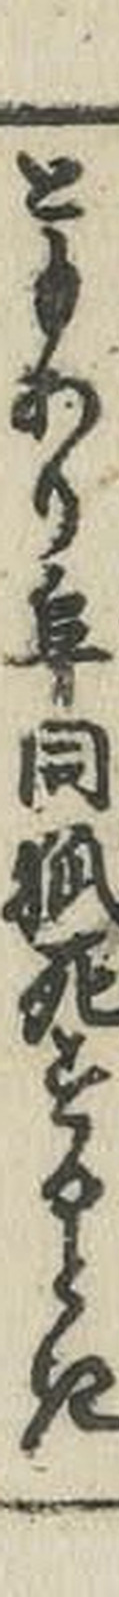ともあり阜同狐死するとき
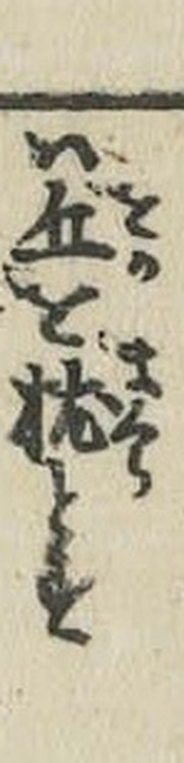は丘を枕とす
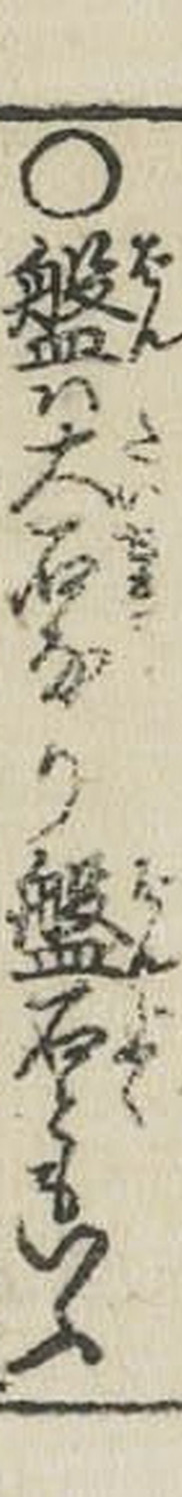○盤は大石なり盤石ともいふ
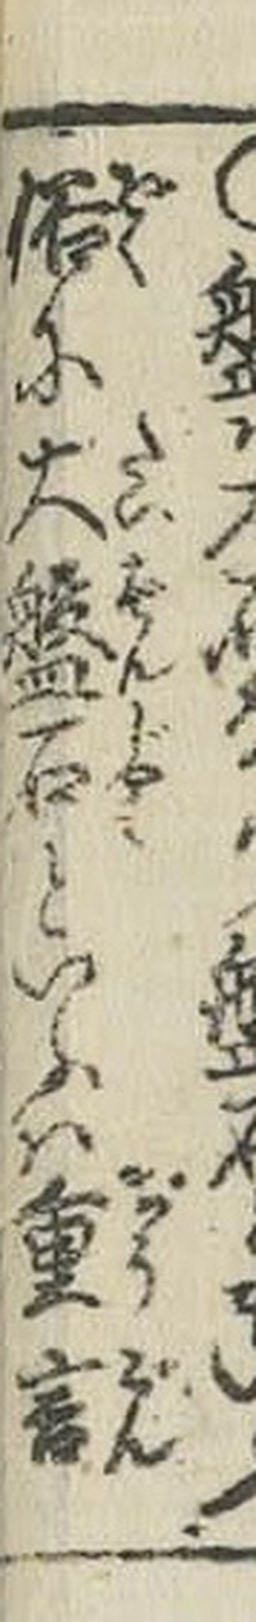俗に大磐石といふは重言
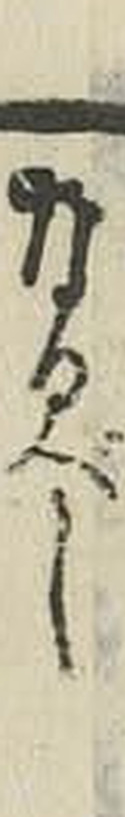なるべし
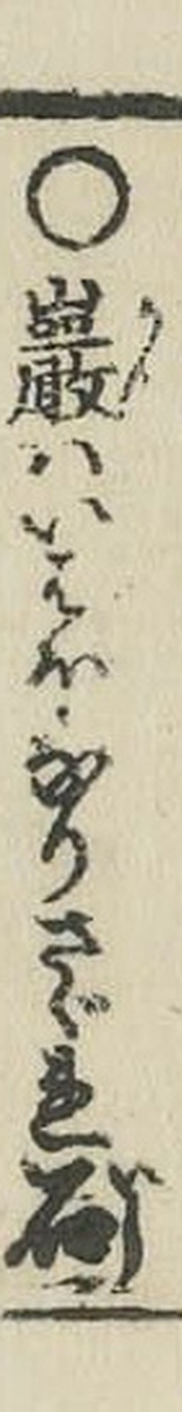○巌はいはほなりさゞれ石
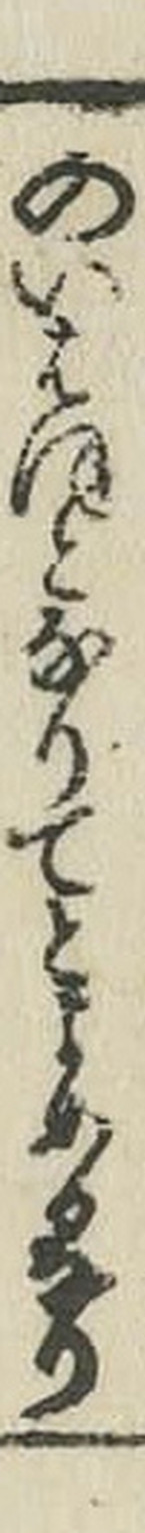のいはほとなりてとよめるなり
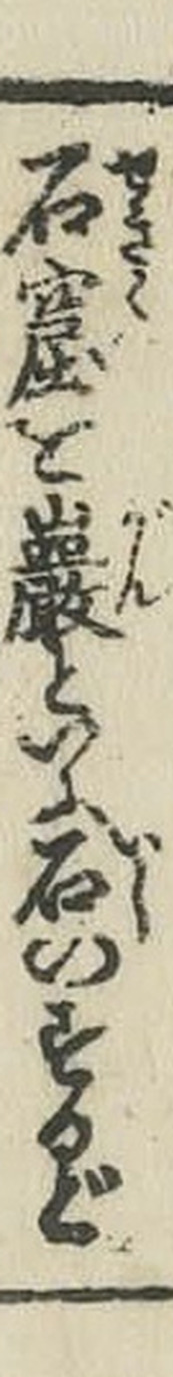石窟を巌といふ石のするど
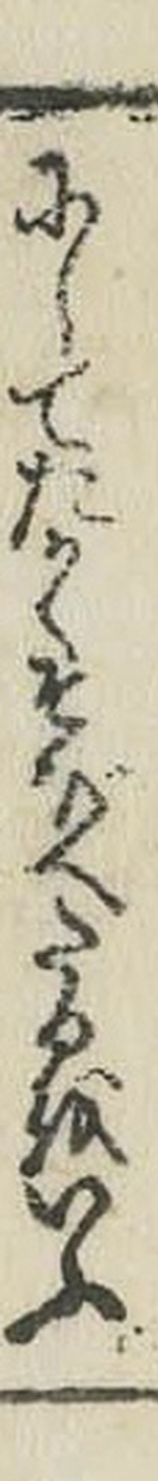にしてたかくそびへたるをいふ
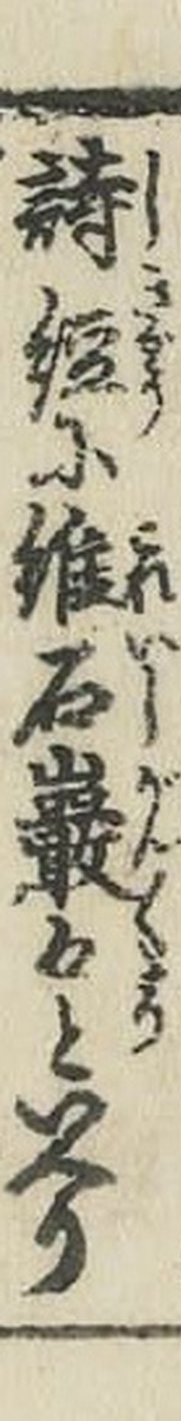詩経に維石巌々といへり
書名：増補頭書訓蒙図彙大成 10巻 2:巻之1-3
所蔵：東京学芸大学教育コンテンツアーカイブ
